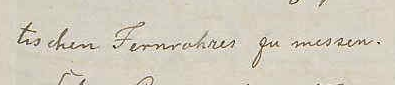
tischen Fernrohres zu messen.
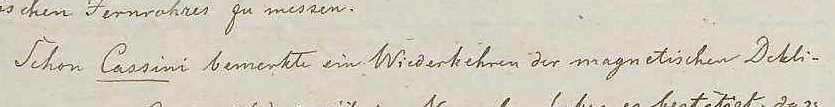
Schon Cassini bemerkte ein Wiederkehren der magnetischen Dekli-
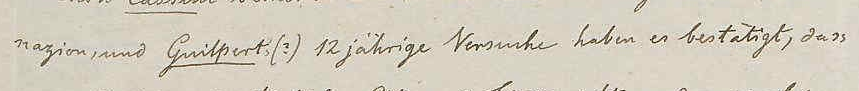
nazion, und Guilpert's 12 jährige Versuche haben es bestätigt, dass
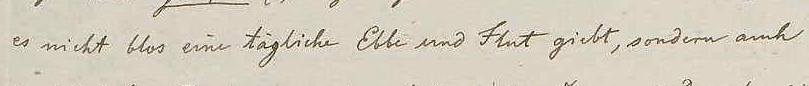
es nicht blos eine tägliche Ebbe und Flut giebt, sondern auch
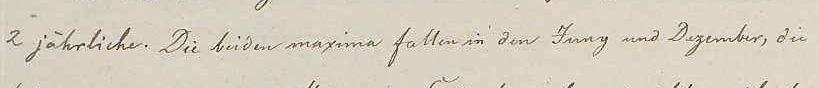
2 jährliche. Die beiden maxima fallen in den Juny und Dezember, die
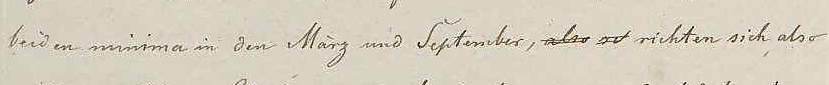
beiden minima in den März und September, also si richten sich also
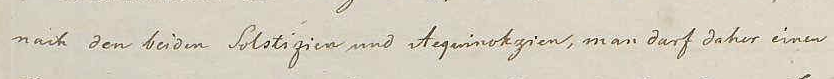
nach den beiden Solstizien und Aequinokzien, man darf daher einen
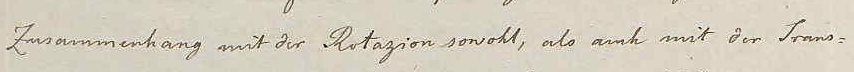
Zusammenhang mit der Rotazion sowohl, als auch mit der Trans-
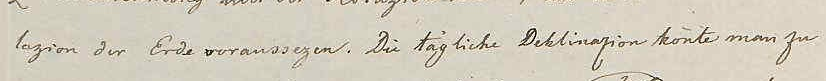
lazion der Erde voraussezen. Die tägliche Deklinazion könte man zu
